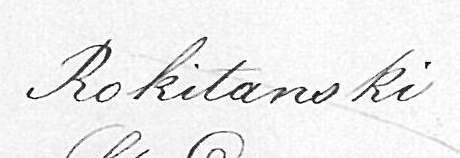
Rokitanski
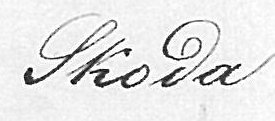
Skoda
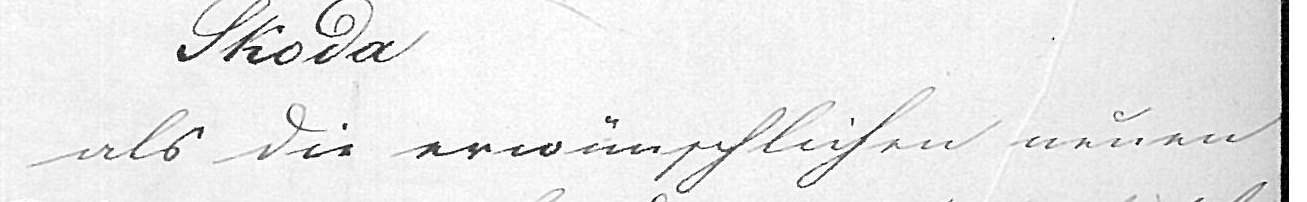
als die erwünschlichen neuen
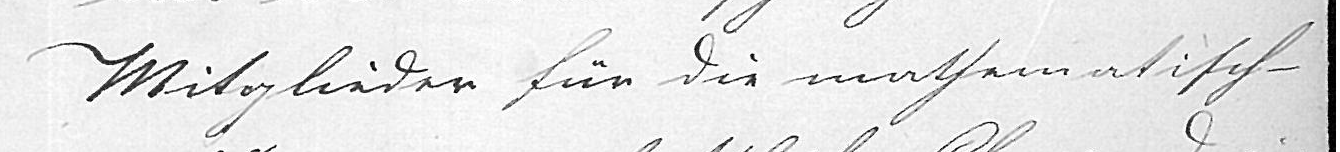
Mitglieder für die mathematisch-
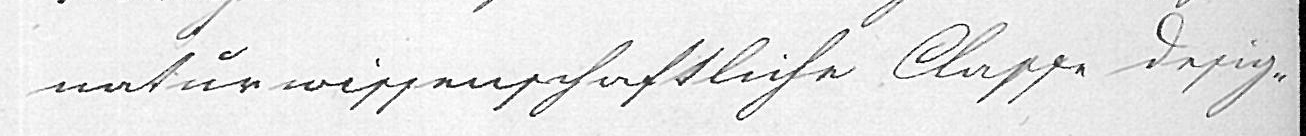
naturwissenschaftliche Classe desig-
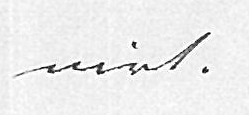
nirt.
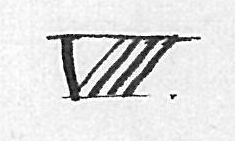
VIII.
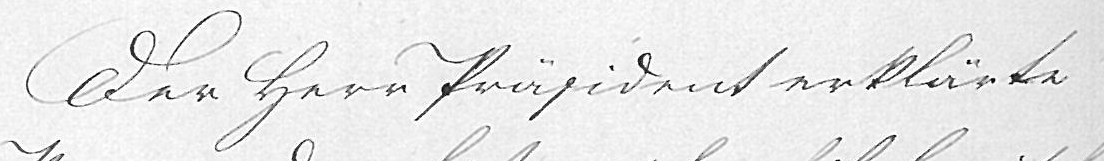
Der Herr Präsident erklärte
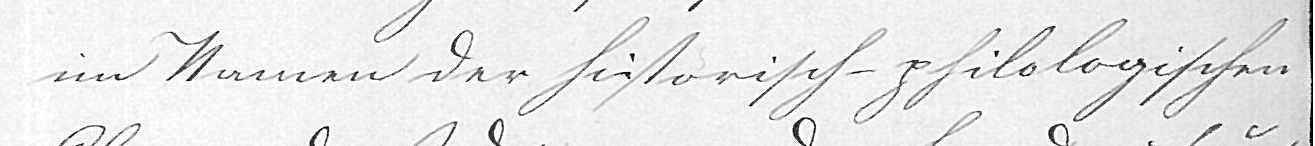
im Namen der historisch-philologischen
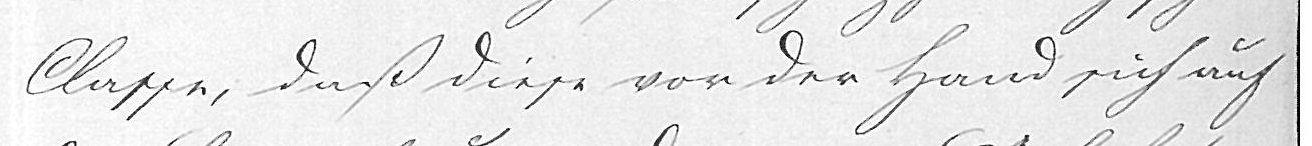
Classe, daß diese vor der Hand sich auf
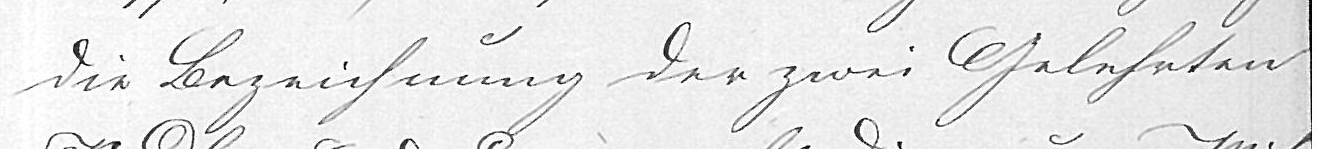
die Bezeichnung der zwei Gelehrten
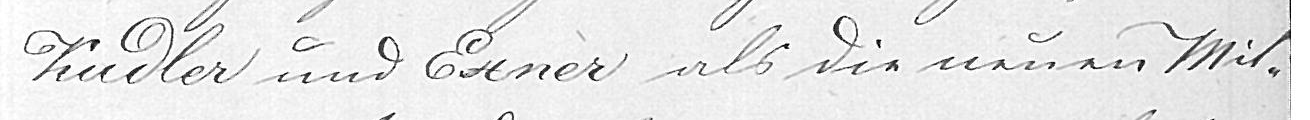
Kudler und Exner als die neuen Mit-
